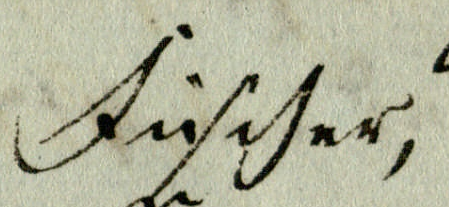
Fischer,
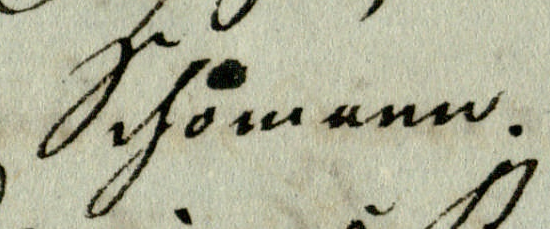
Schömann.
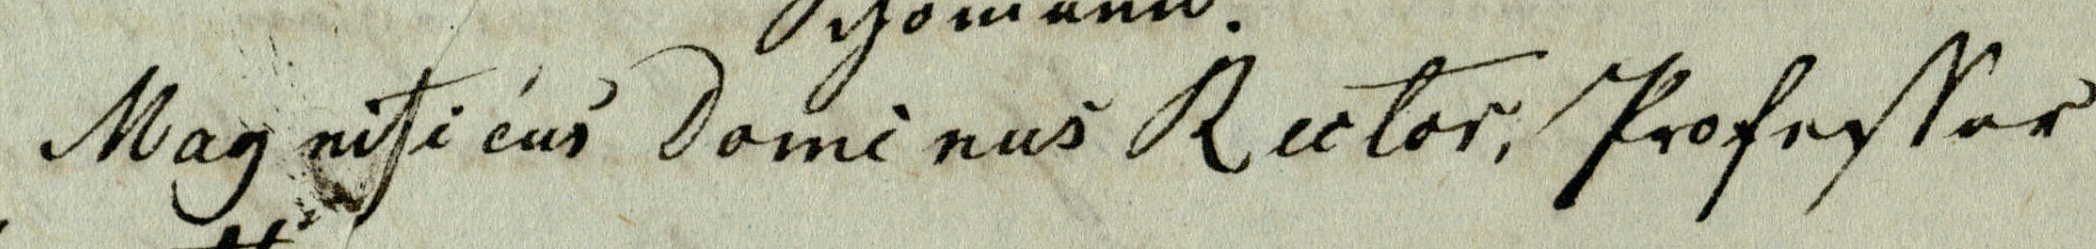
Magnificus Dominus Rector, Professor
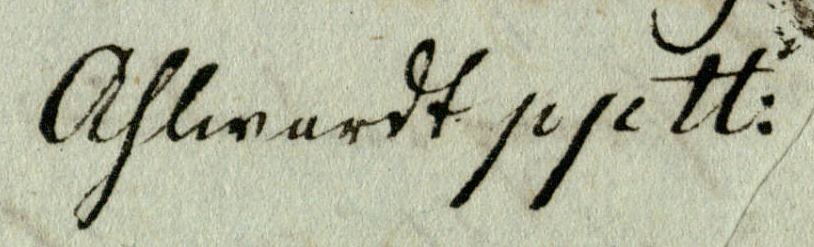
Ahlwardt pptt:
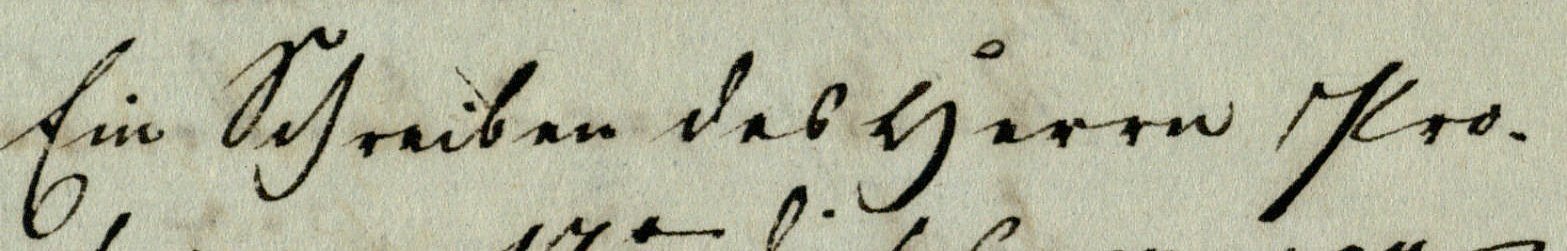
Ein Schreiben des Herrn Pro¬
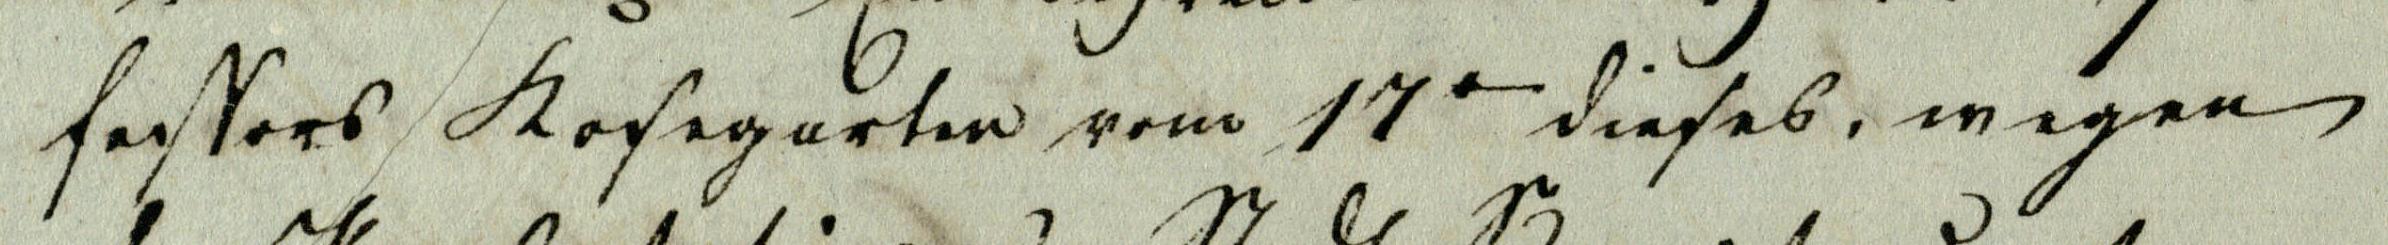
fessors Kosegarten vom 17 ten dieses, wegen
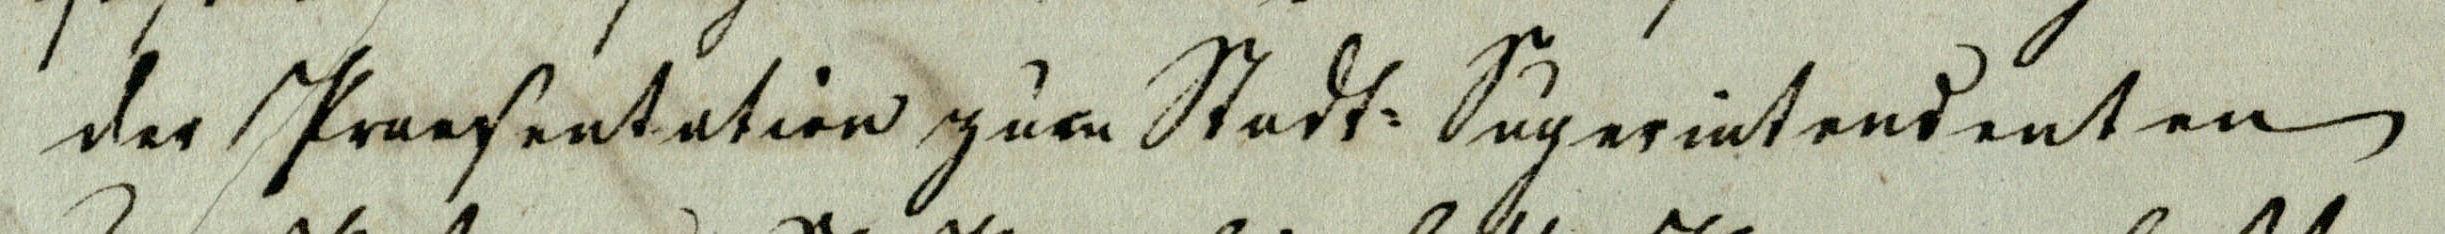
der Praesentation zum Stadt- Superintendenten
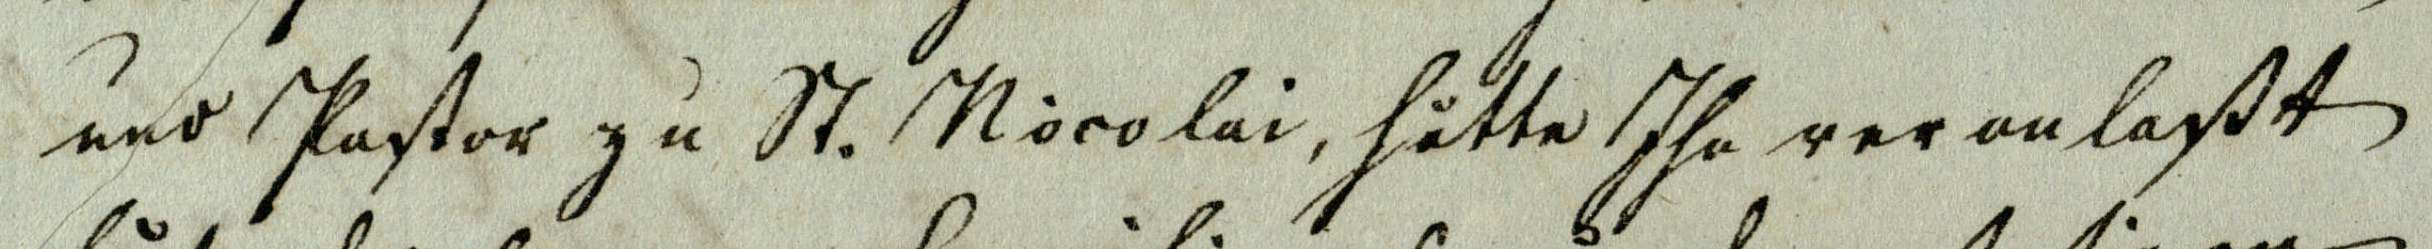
und Pastor zu St. Nicolai, hätte Ihn veranlaßt,
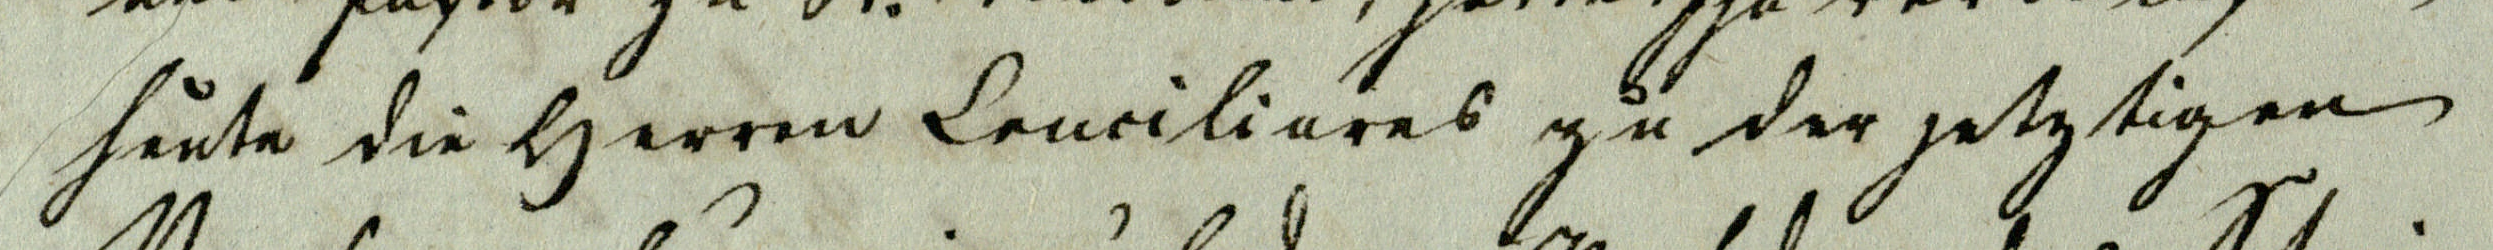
heute die Herren Conciliares zu der jetztigen
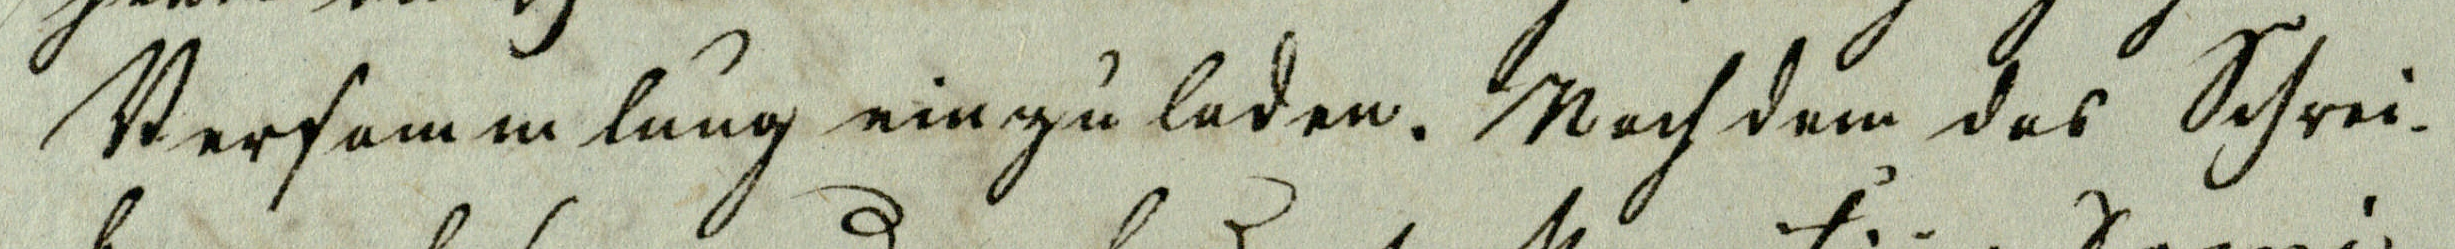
Versammlung ein zu laden. Nach dem das Schrei¬
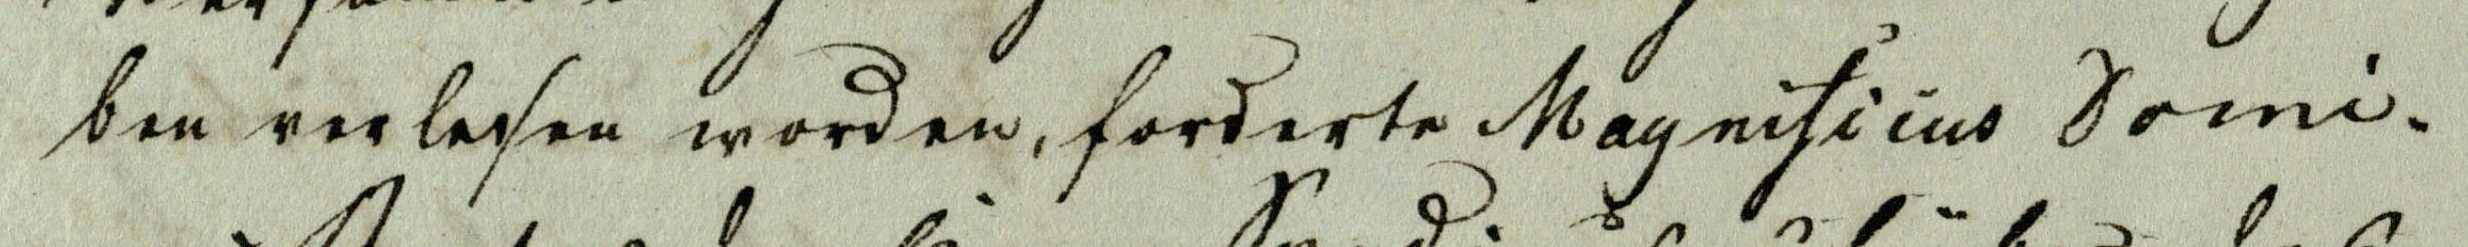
ben verlesen worden, forderte Magnificus Domi¬
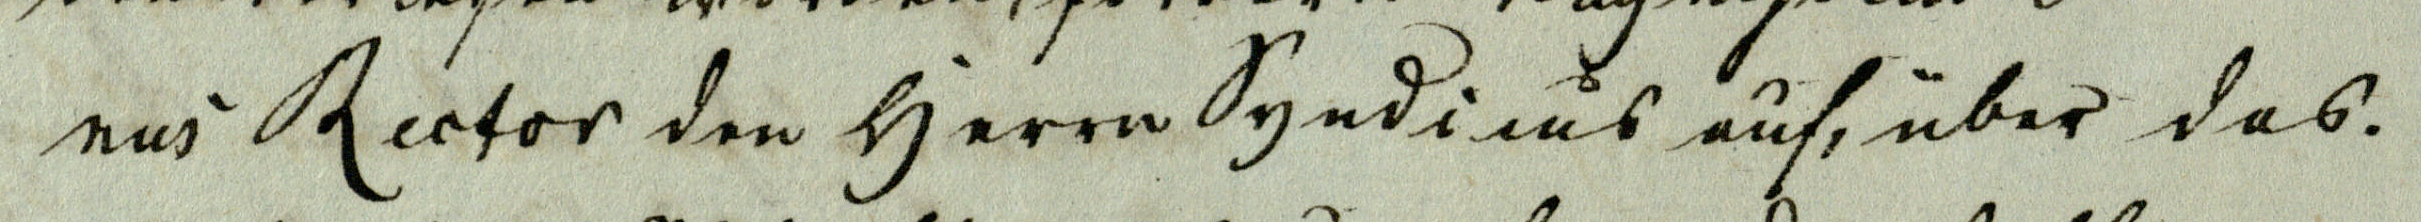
nus Rector den Herrn Syndicus auf, über das¬
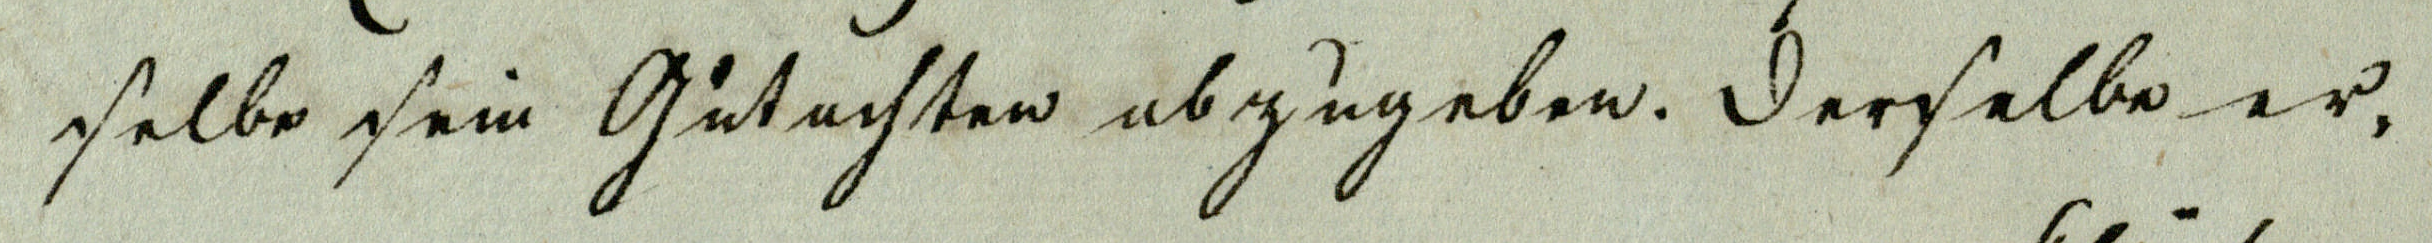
selbe sein Gutachten abzugeben. Derselbe er¬
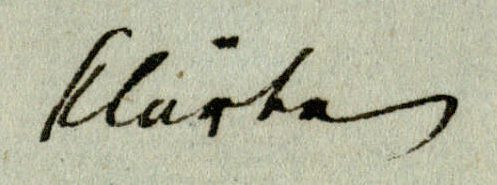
klärte
